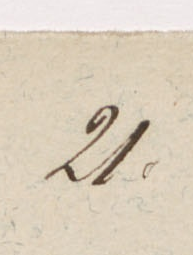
21.
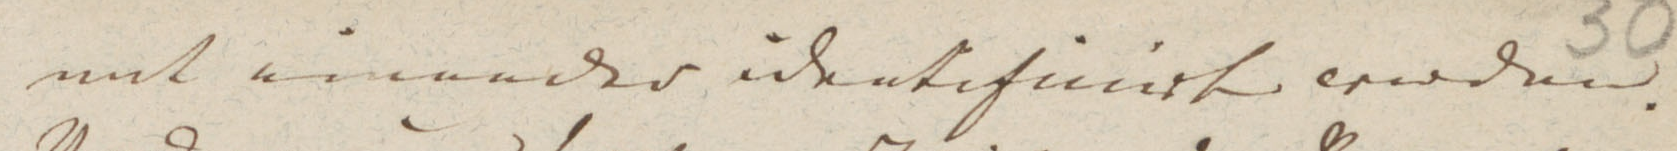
mit einander identificirt werden.
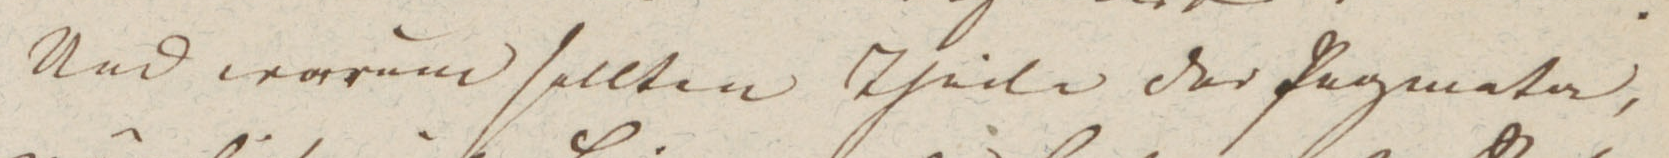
Und warum sollten Theile der Pegmata,
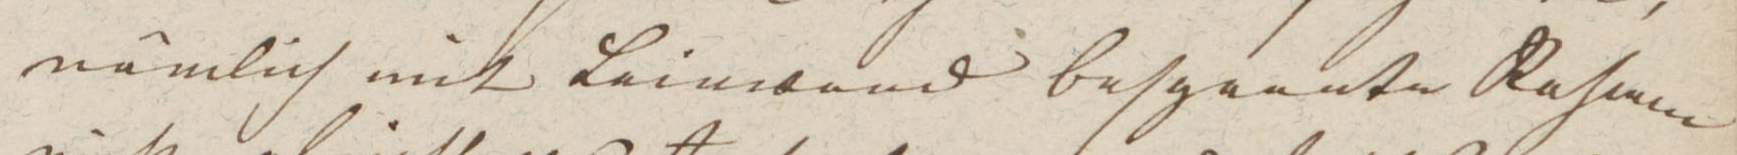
nämlich mit Leinwand bespannte Rahmen
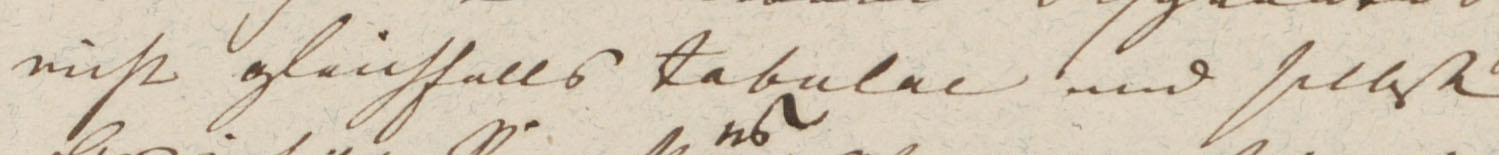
nicht gleichfalls tabulae und selbst
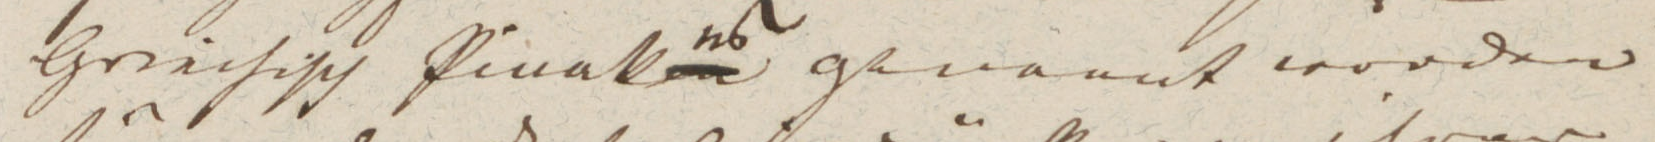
Griechisch Pinaknes genannt worden
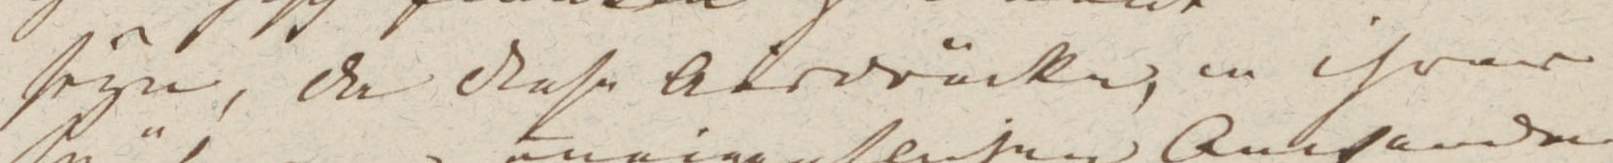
seyn, da diese Ausdrücke, in ihrer
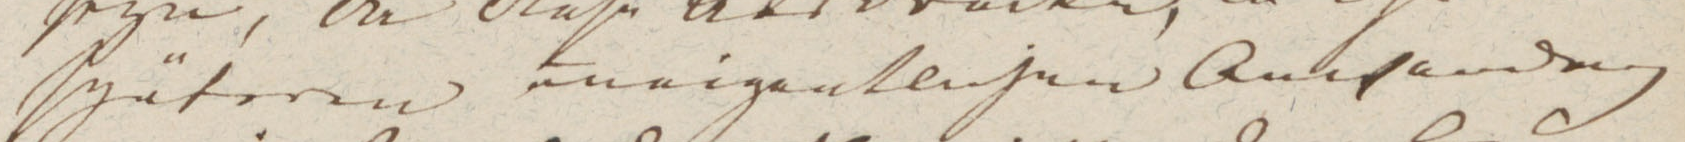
späteren uneigentlichen Anwendung
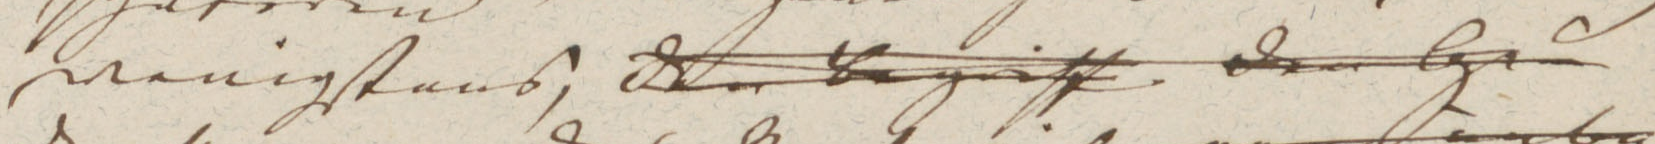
wenigstens, den Begriff den Ge-
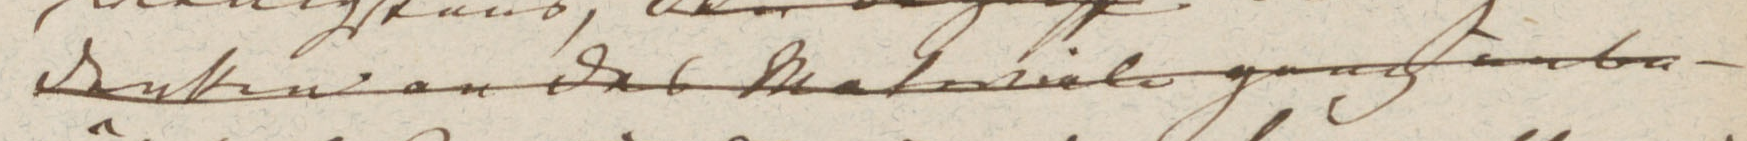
danken an das Material ganz unbe-
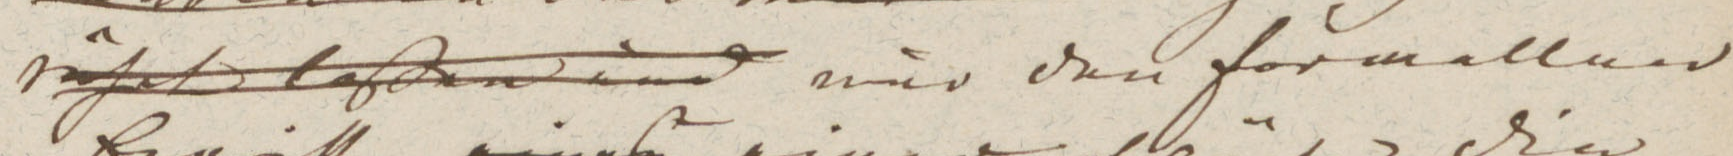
rührt lassen und nur den formellen
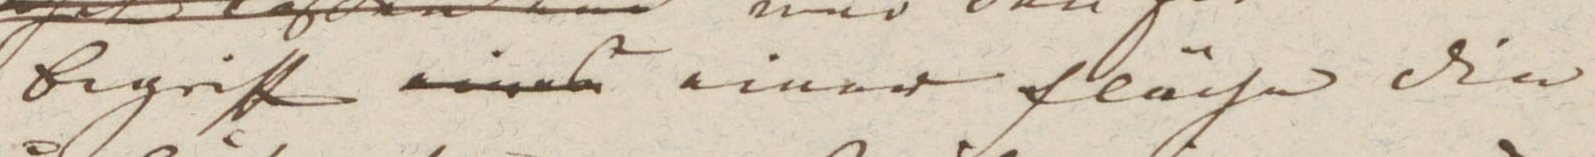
Begriff eines einer Fläche die
